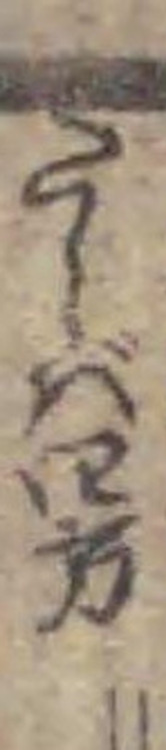たらば四方
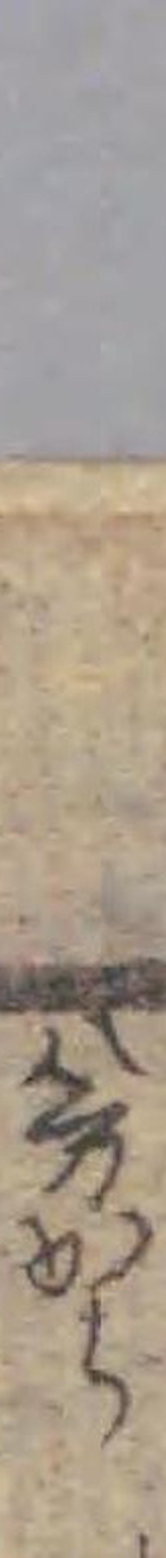八方から
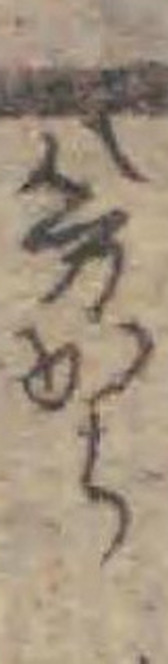八方から
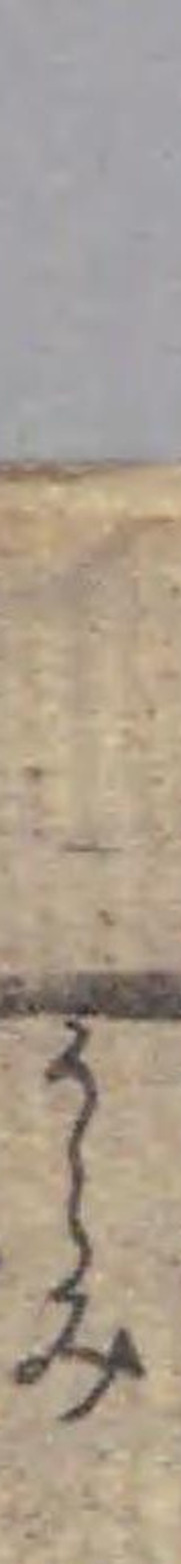うらみ
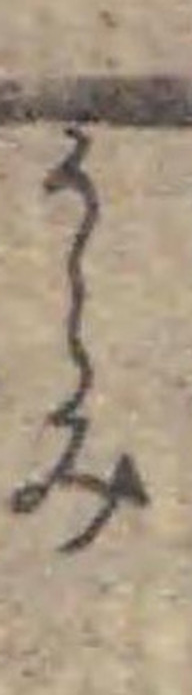うらみ
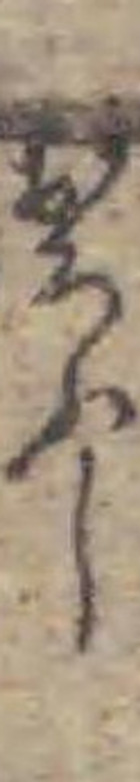おろふし
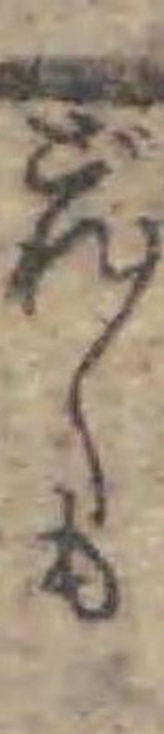どれ〳〵も
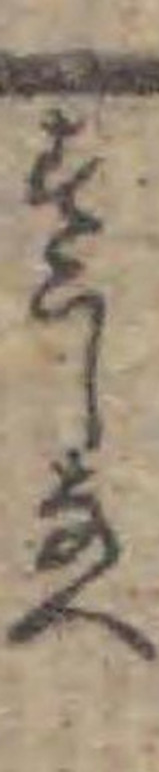すこしなへ
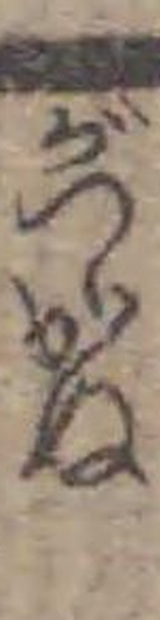がつゝかぬ
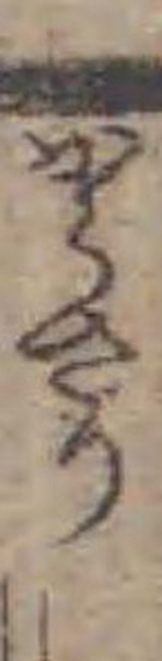からさり
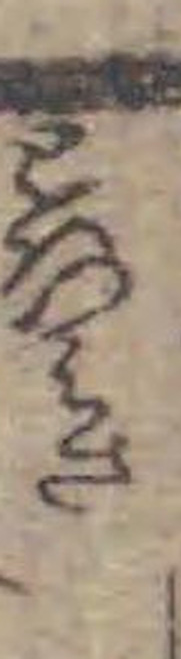とはつみさ
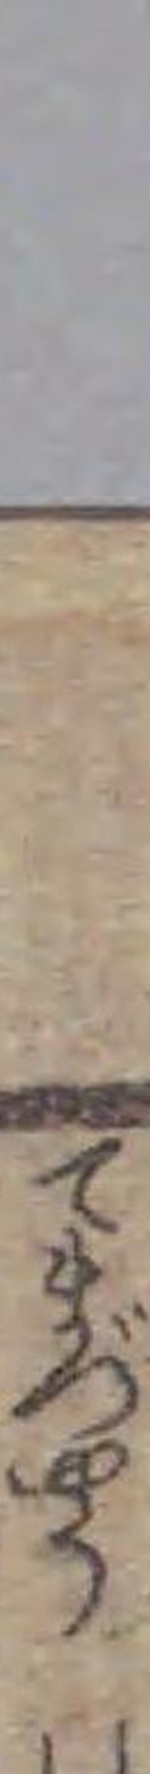てまづやう
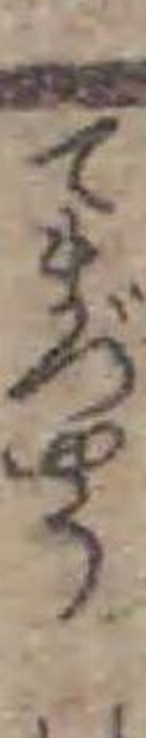てまづやう
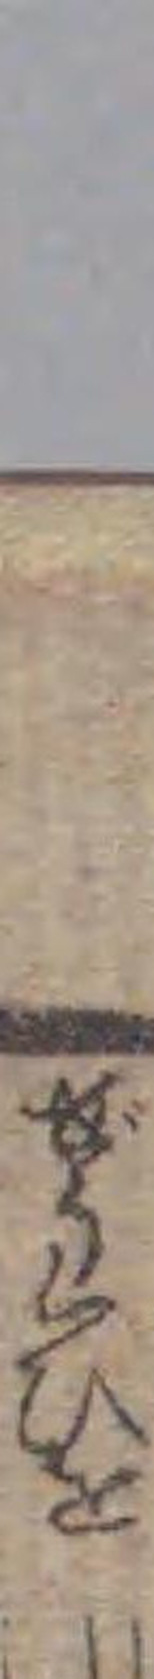ぜうくひを
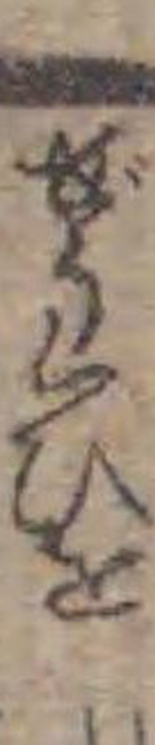ぜうくひを
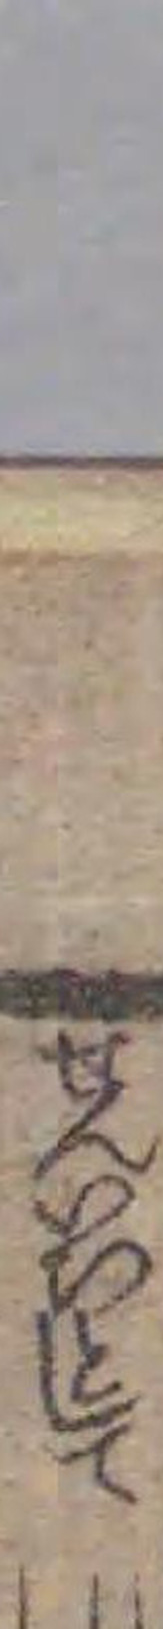せんいちとして
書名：通風伊勢物語 : 3巻
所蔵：国立国会図書館 National Diet Library, JAPAN
